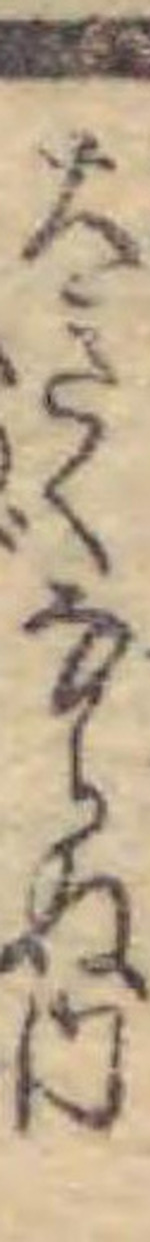大きくならぬ内
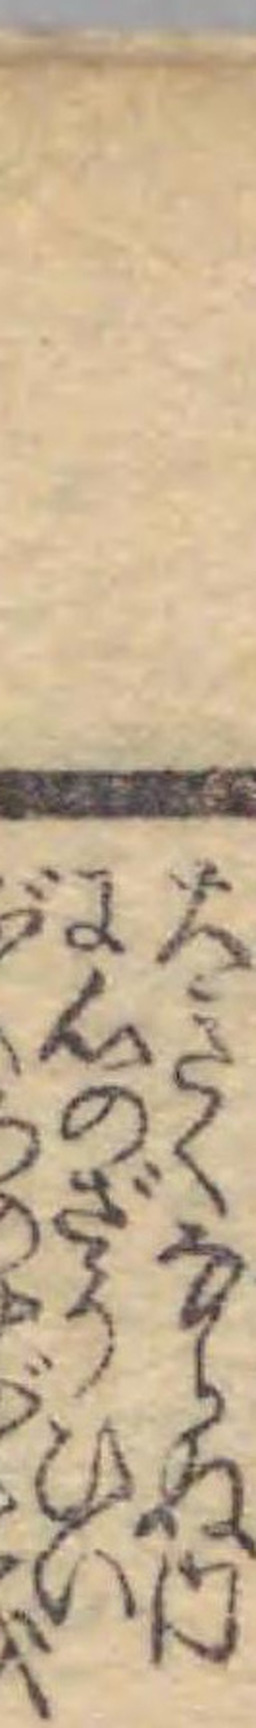に心のざうひい
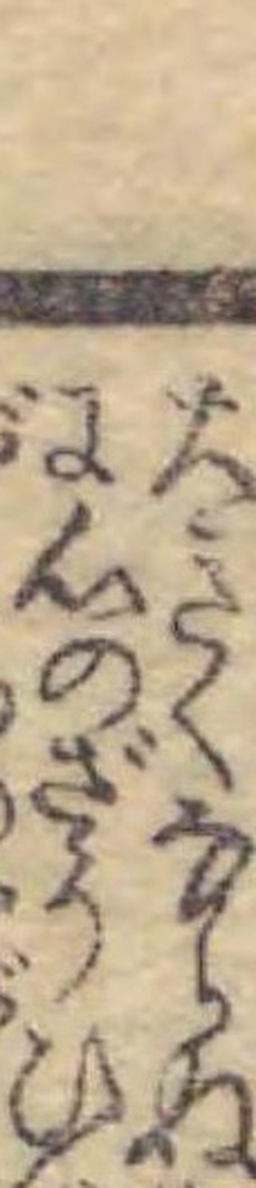に心のざうひい
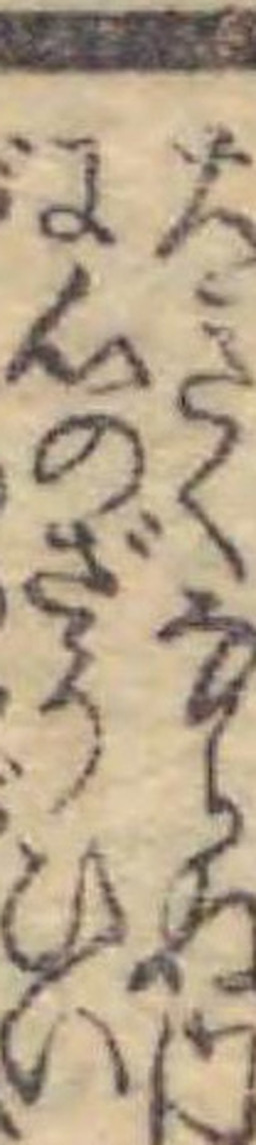に心のざうひい
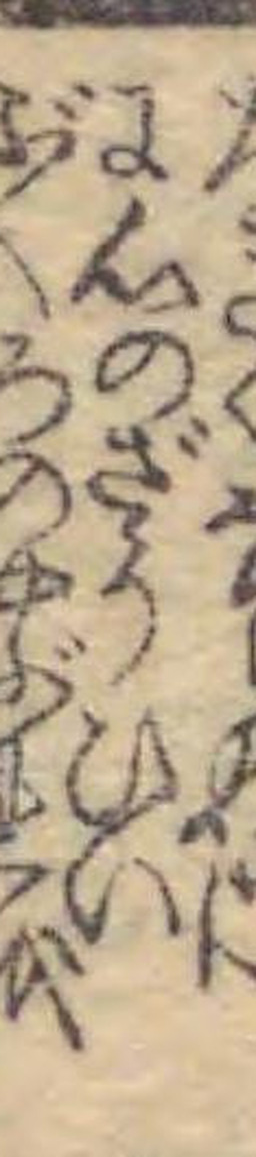ぶくろのやぶれを
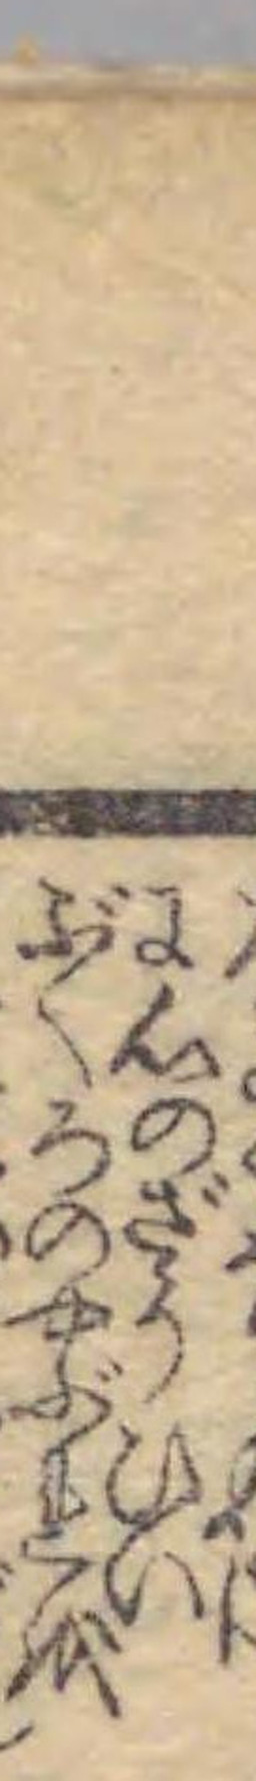ぶくろのやぶれを
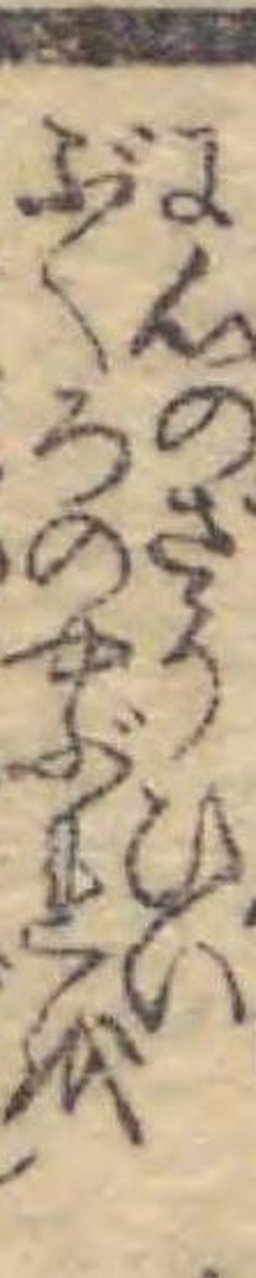ぶくろのやぶれを
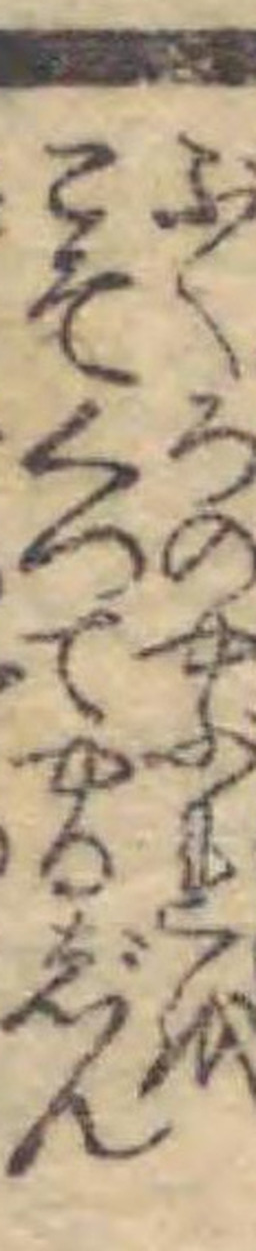こそくつてやるじん
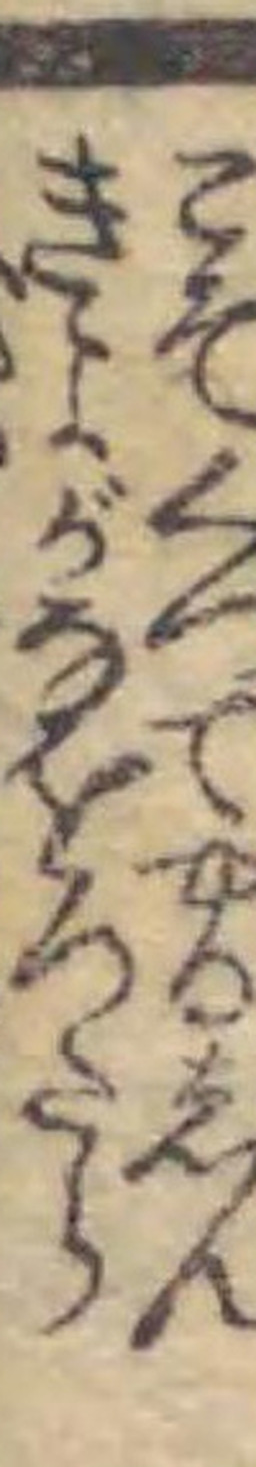きよがなをつたら
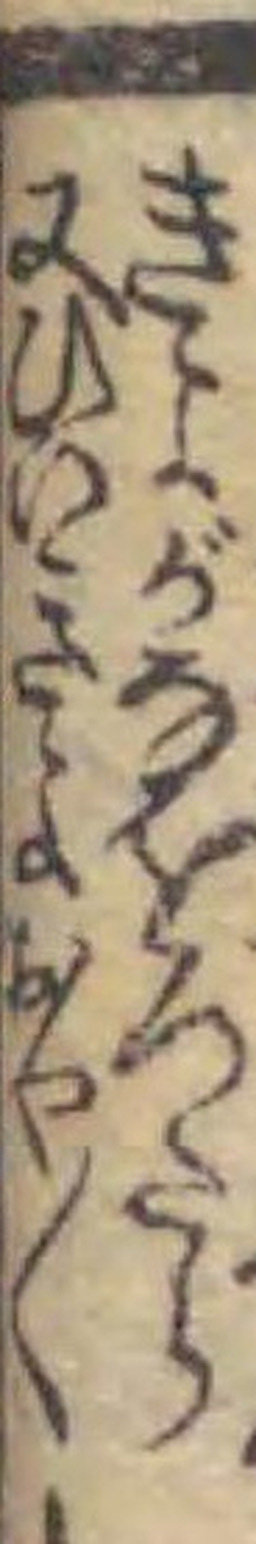又ひいきにおや〳〵
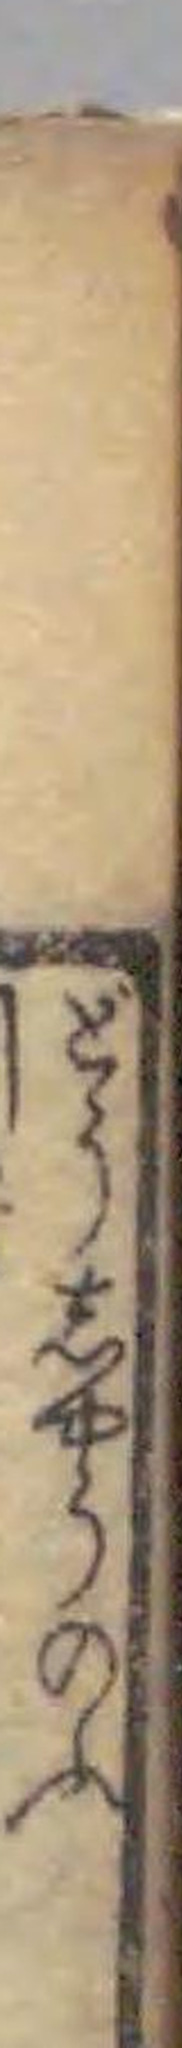どうしやうのふ
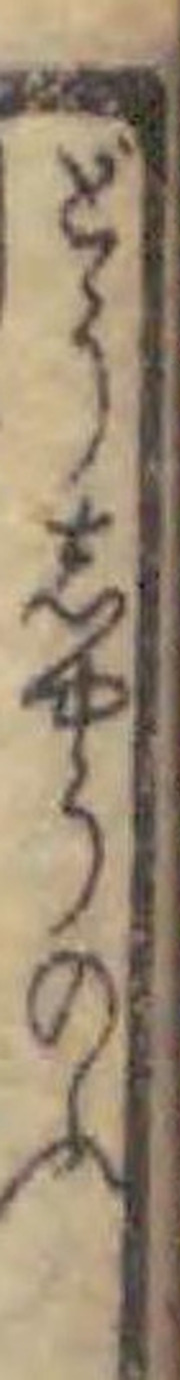どうしやうのふ
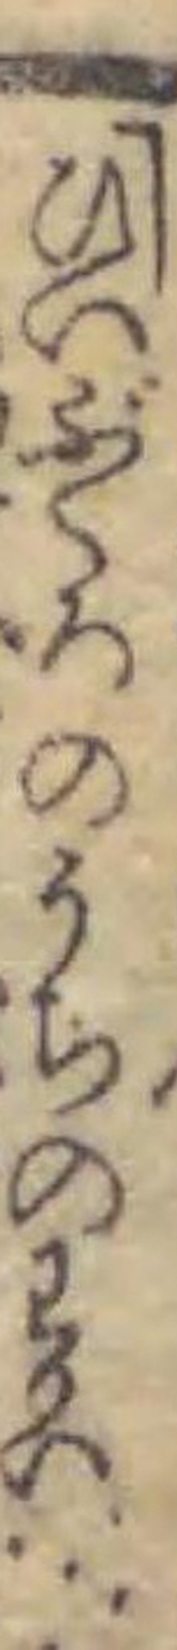〽ひいぶくろのうちのわかい
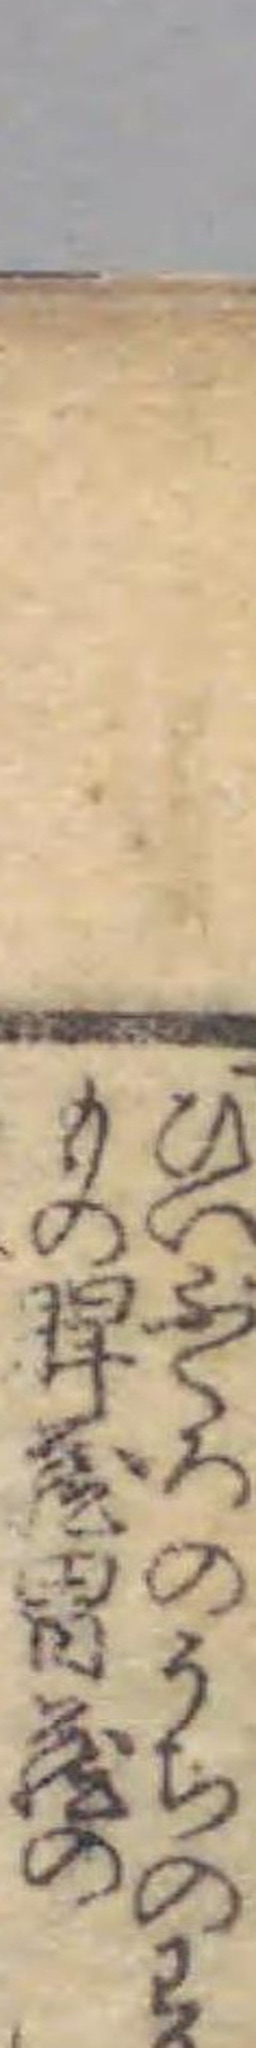もの脾蔵胃蔵の
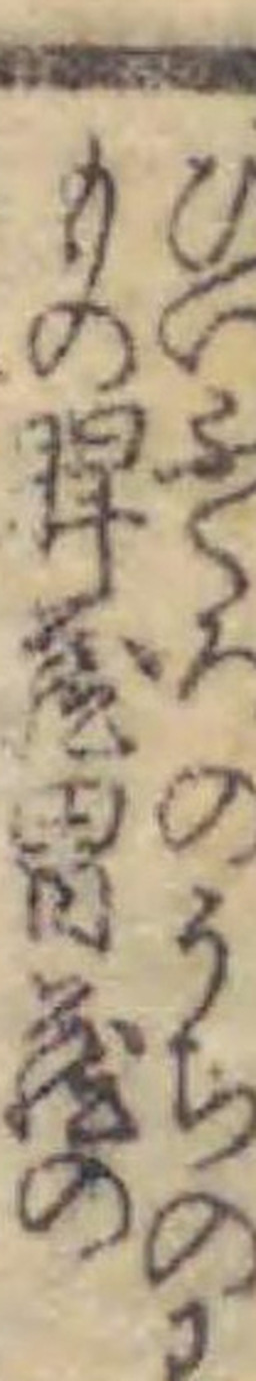もの脾蔵胃蔵の
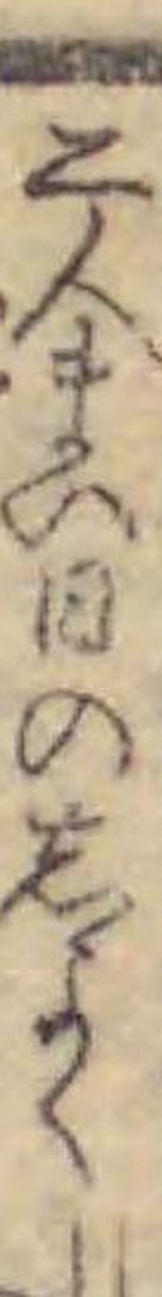二人まい日のしよく
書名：十四傾城腹之内 : 3巻
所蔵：国立国会図書館 National Diet Library, JAPAN
